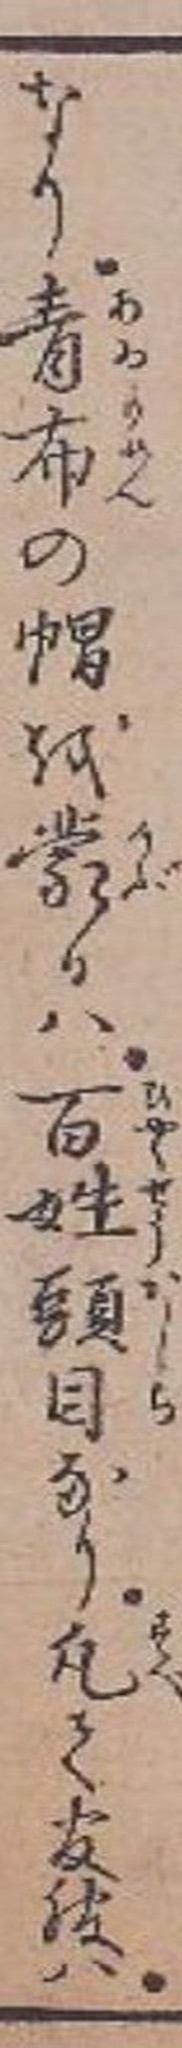なり、青布の帽を蒙るは、百姓頭目なり、凡て官服は、
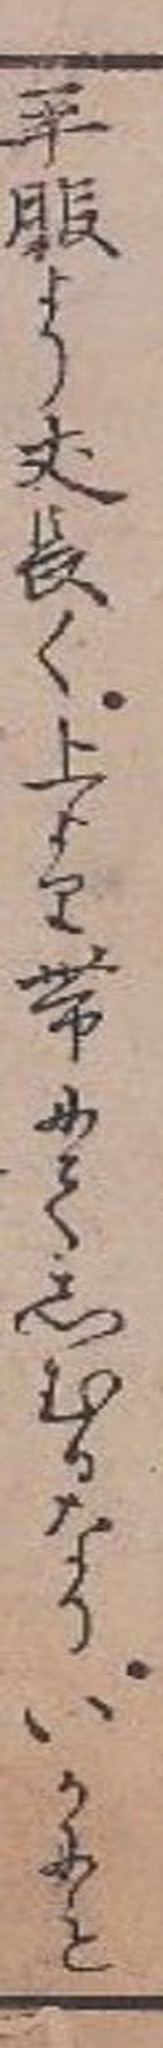平服より丈長く、上より帯にてしむるなり、いかにも
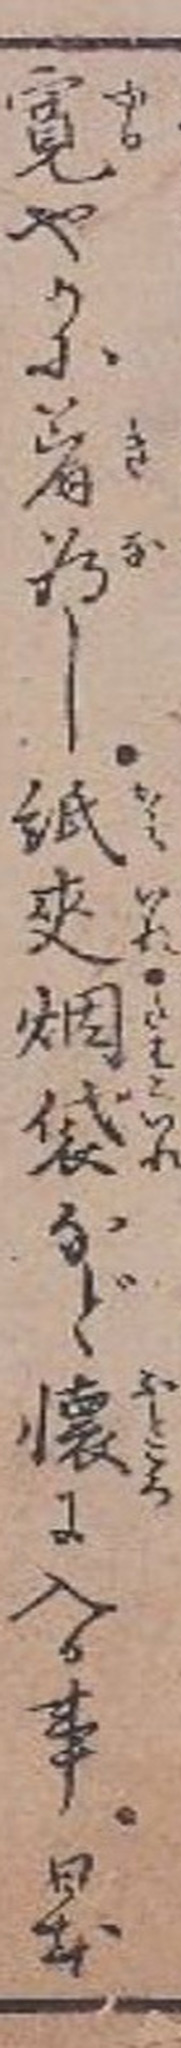寛やかに着為し、紙夾、烟袋など懐に入る事、日本
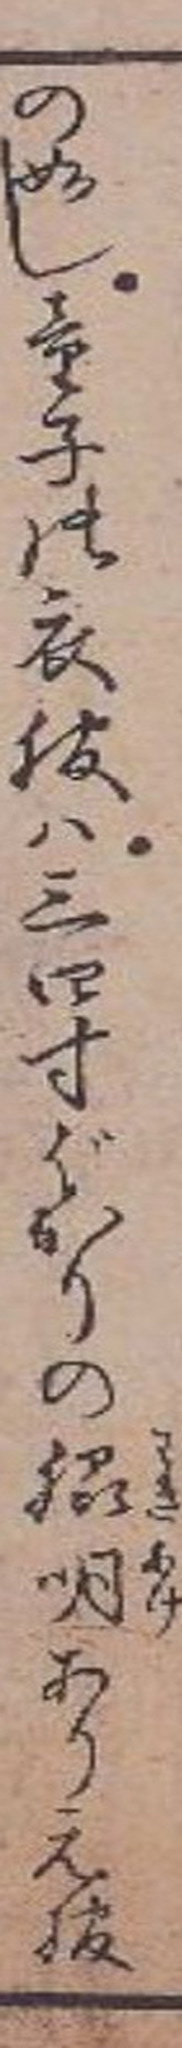の如し、童子の衣服は、三四寸ばかりの脇明あり元服
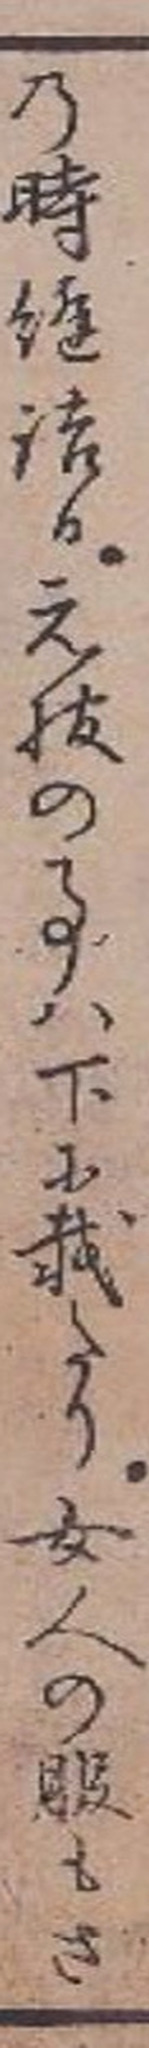の時縫詰る、元服の事は下に載たり、女人の服もさ
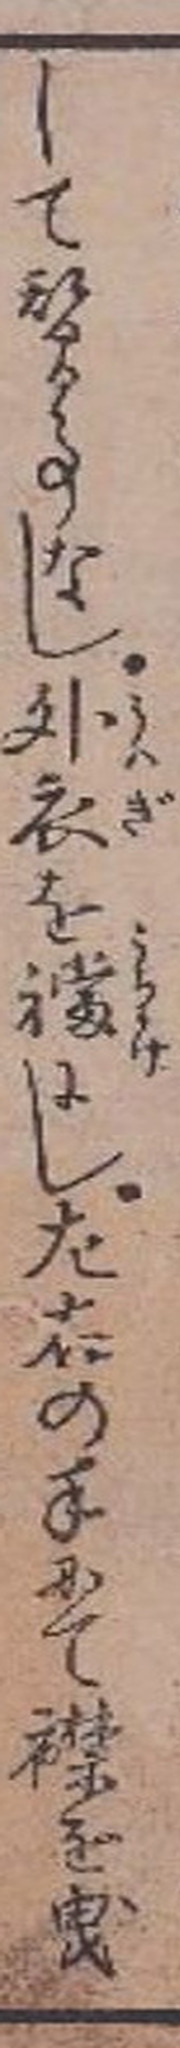して替る事なし、外衣を襠にし、左右の手にて襟を曳
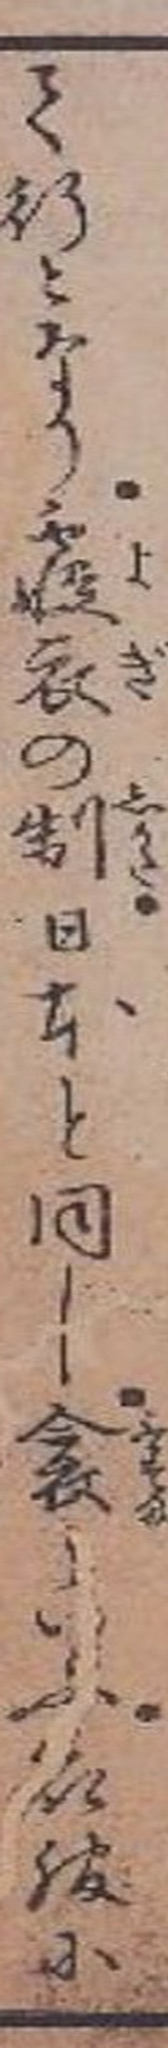て行となり、寢衣の制、日本と同し、衾といふ、名服に

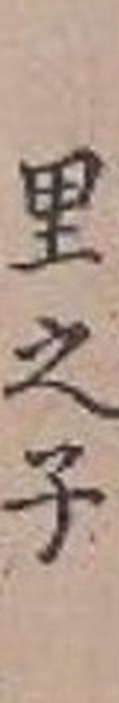里之子
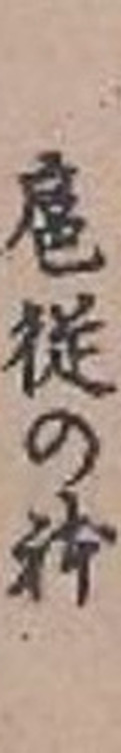扈従の躰
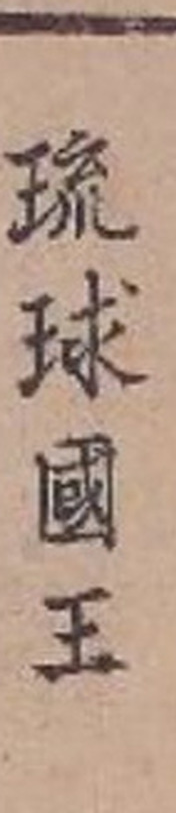琉球国王

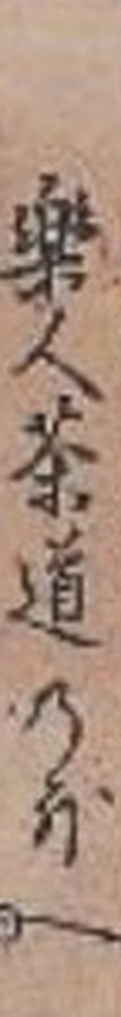国王楽人茶道の外
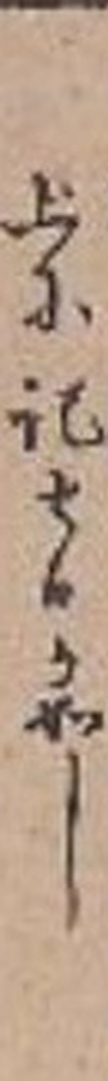上に記せるか如し
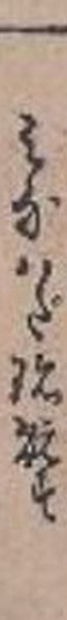はなはだ珍翫す

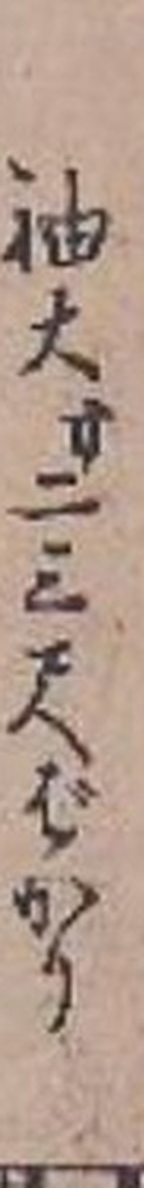袖大二三尺ばかり
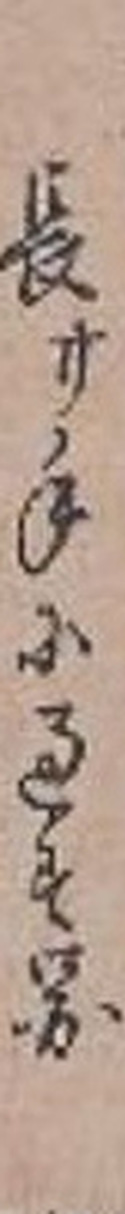長手に過す図
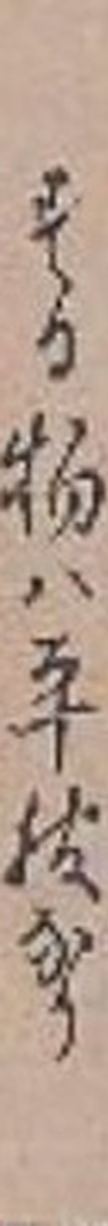する物は平服なり
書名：琉球談
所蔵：University of the Ryukyus Library
